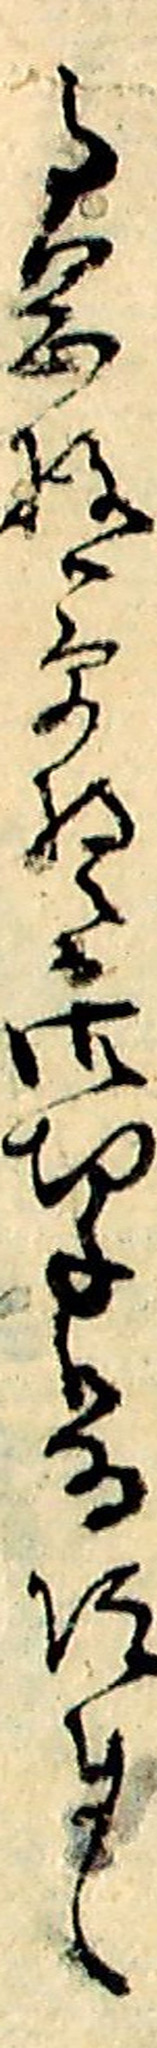高岡様御受持にて御切手被為仰付候

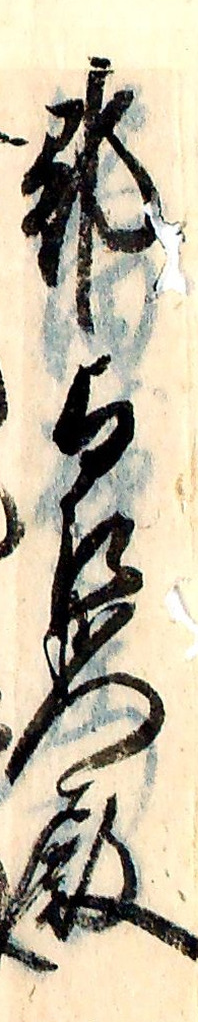郡与左衛門殿
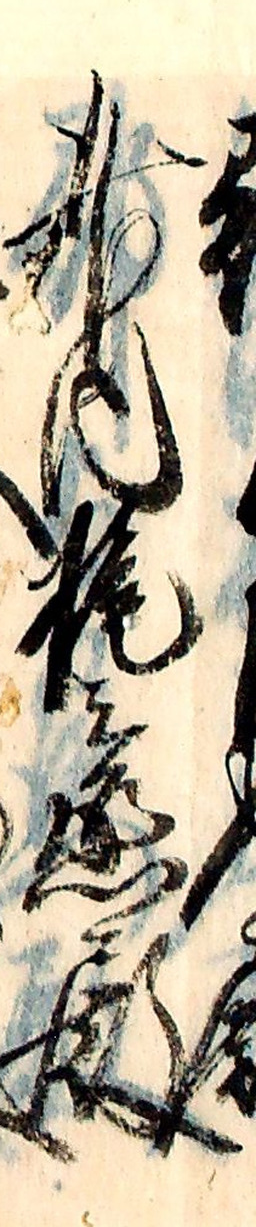竹内梶之丞殿
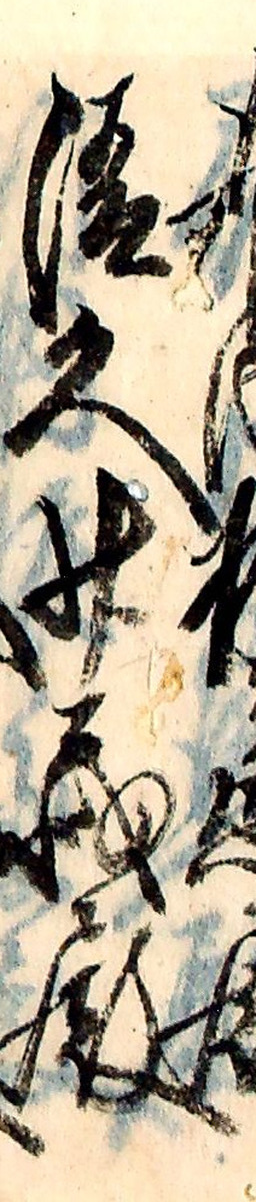清久竹蔵殿
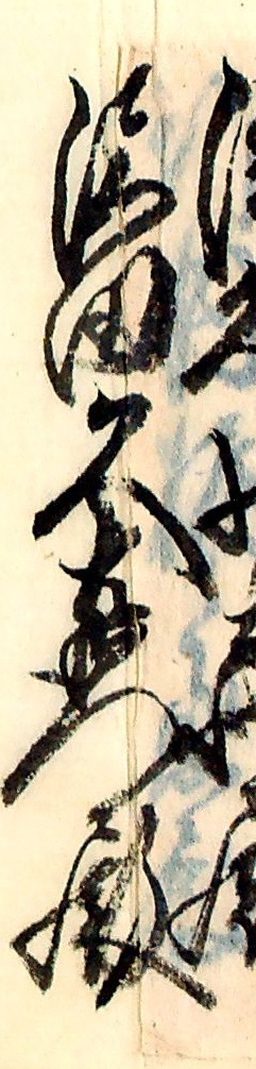沢田久左衛門殿
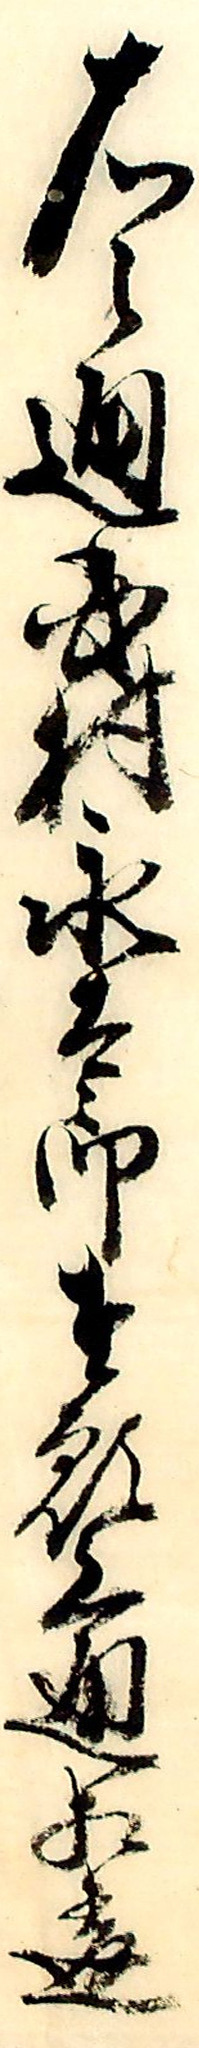右之通当村永太郎奉願上通相違
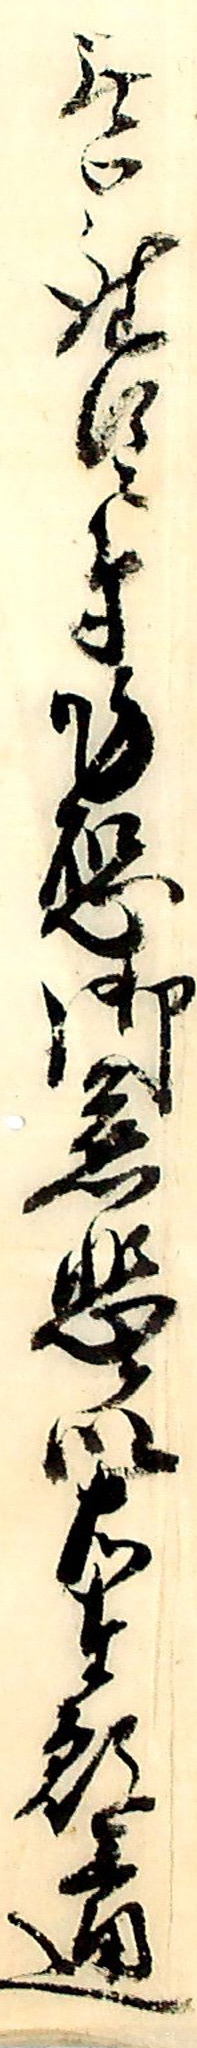無御座候に付乍恐御慈悲を以右奉願上通
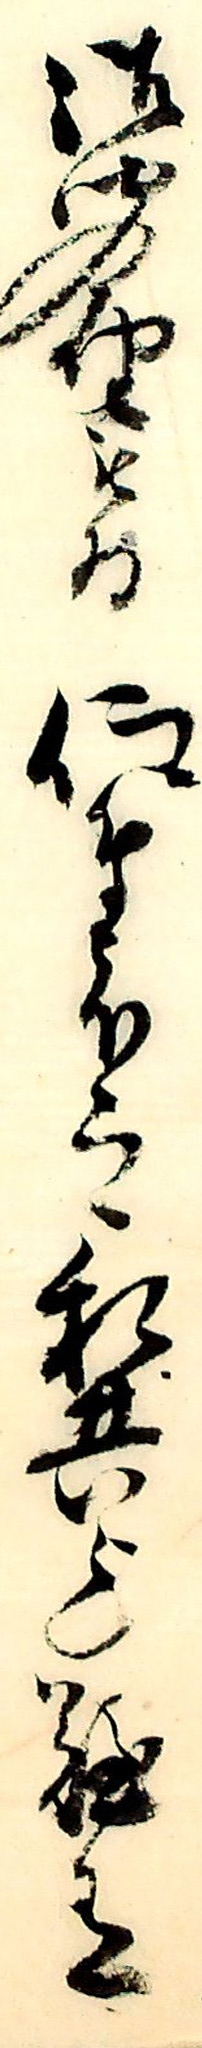御聞届被為仰付被下候はゝ私共迄難有
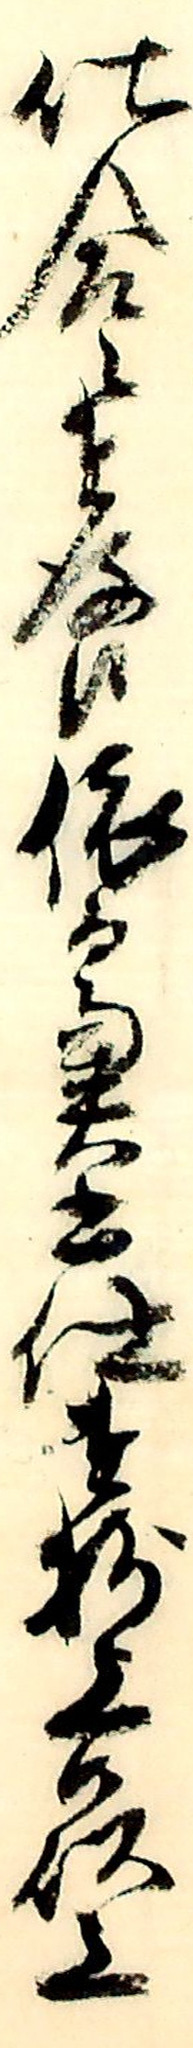仕合に奉存候依て奥書仕奉指上候以上
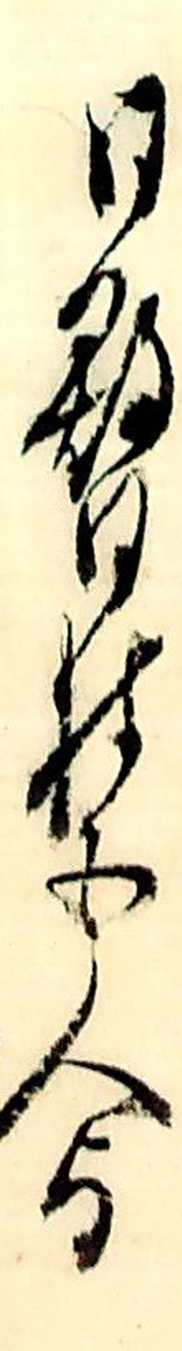同郡同村五人与
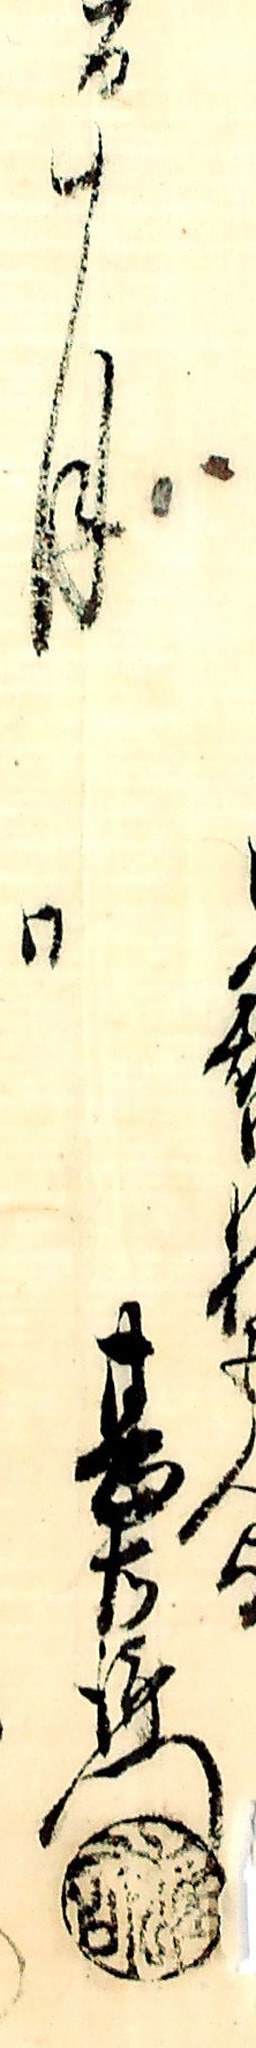酉十月甚右衛門
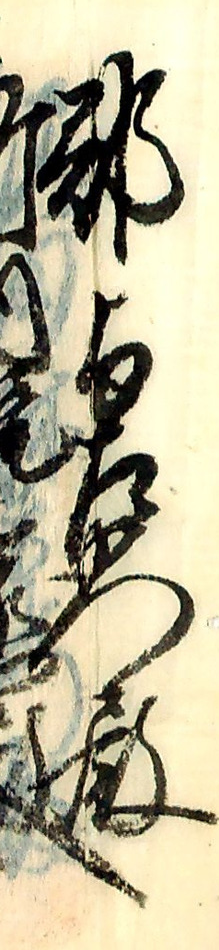郡与左衛門殿
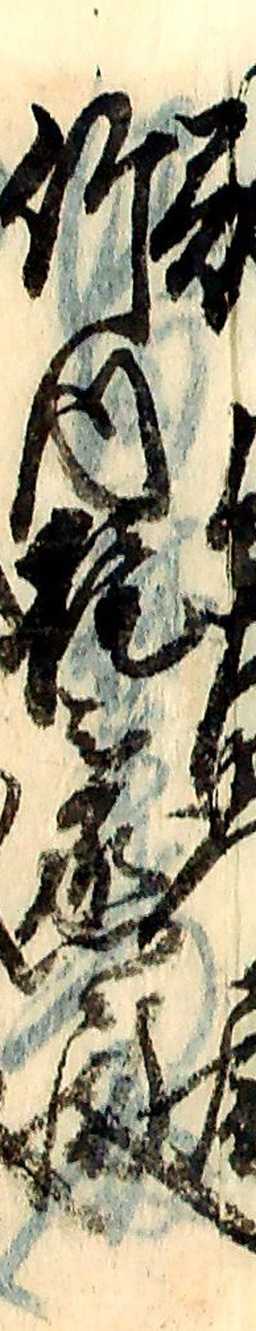竹内梶之丞殿
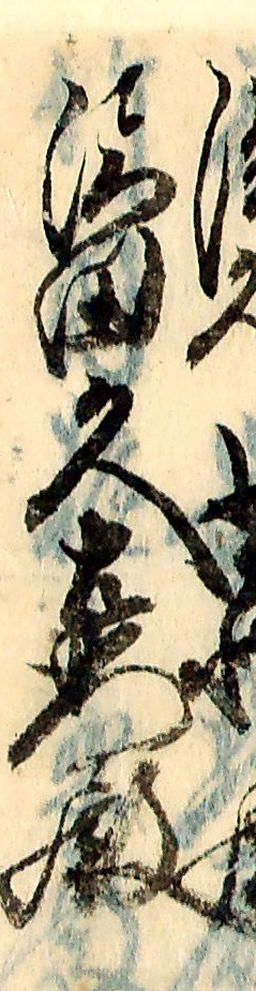沢田久左衛門殿

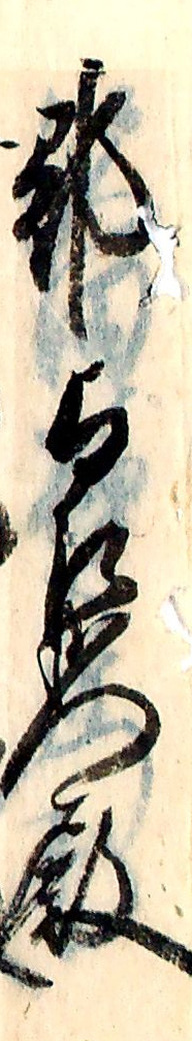郡与左衛門殿
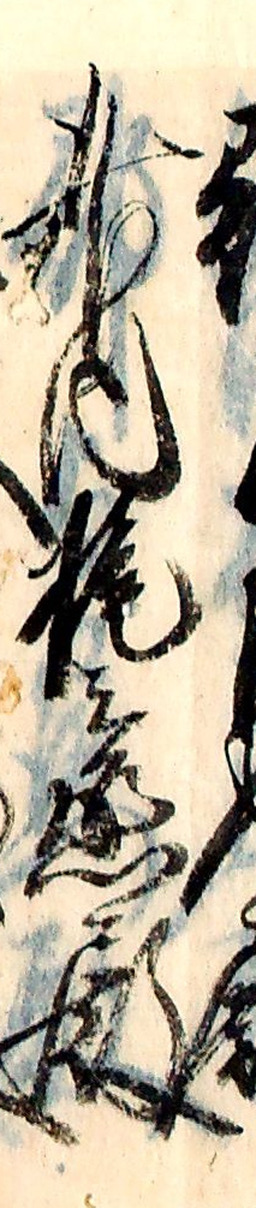竹内梶之丞殿
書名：諸御願書控(後藤氏壱番）
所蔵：鳴門教育大学 Naruto University of Education
